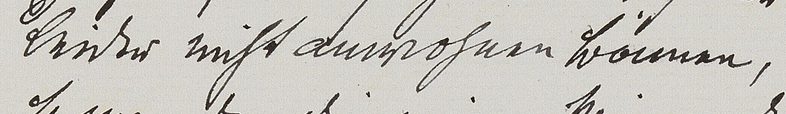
leider nicht anwohnen können,
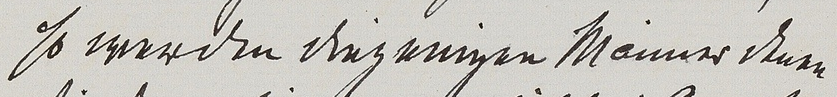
so werden diejenigen Männer denen
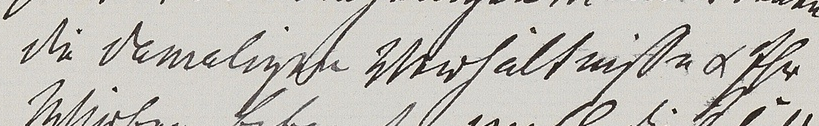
die damaligen Verhältnisse & Ihr
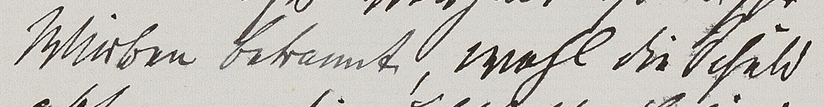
Wirken bekannt, wohl die Schuld
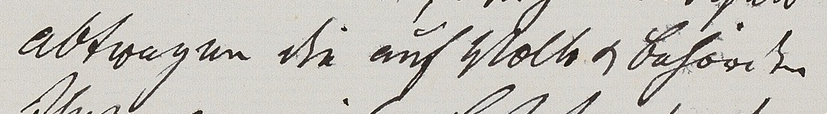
abtragen die auf Volk & Behörden
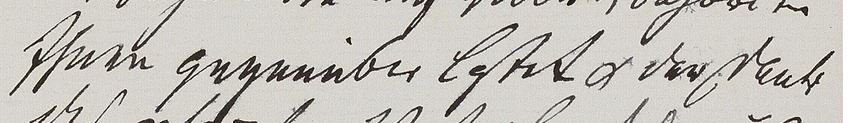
Ihnen gegenüber lastet & der Dank
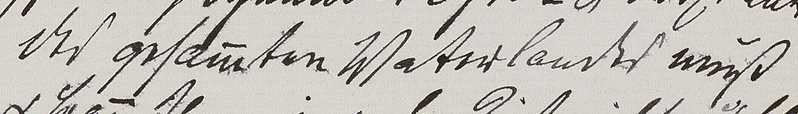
des gesammten Vaterlandes muß
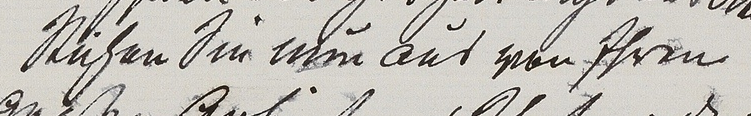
Ruhen Sie nun aus von Ihren
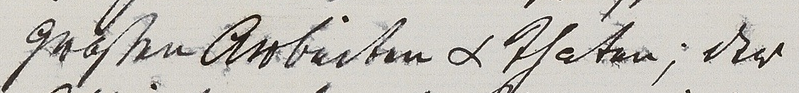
großen Arbeiten & Thaten; der
